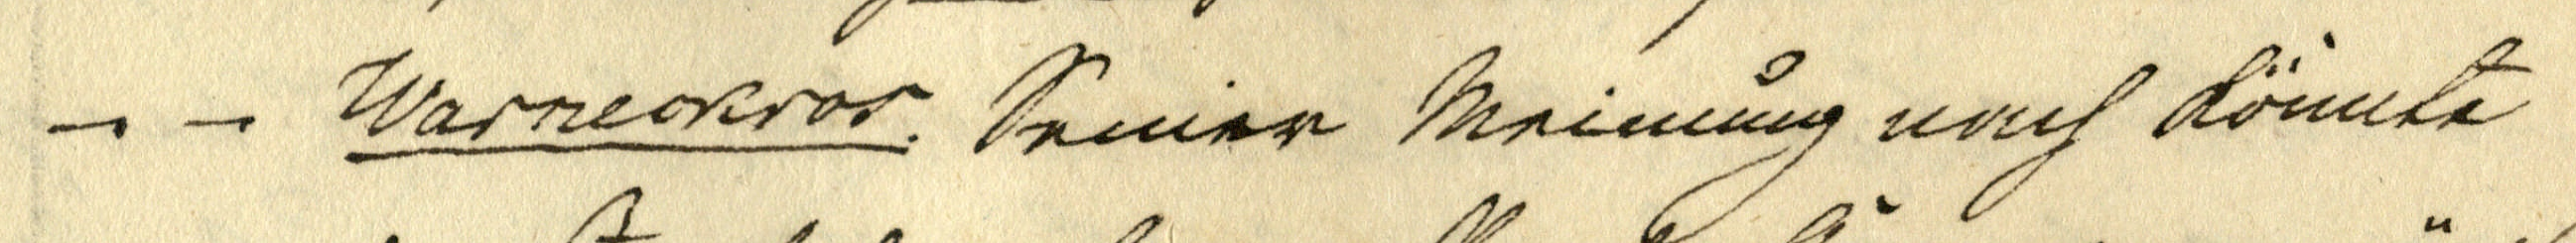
Warneckros. Seiner Meinung nach könnte
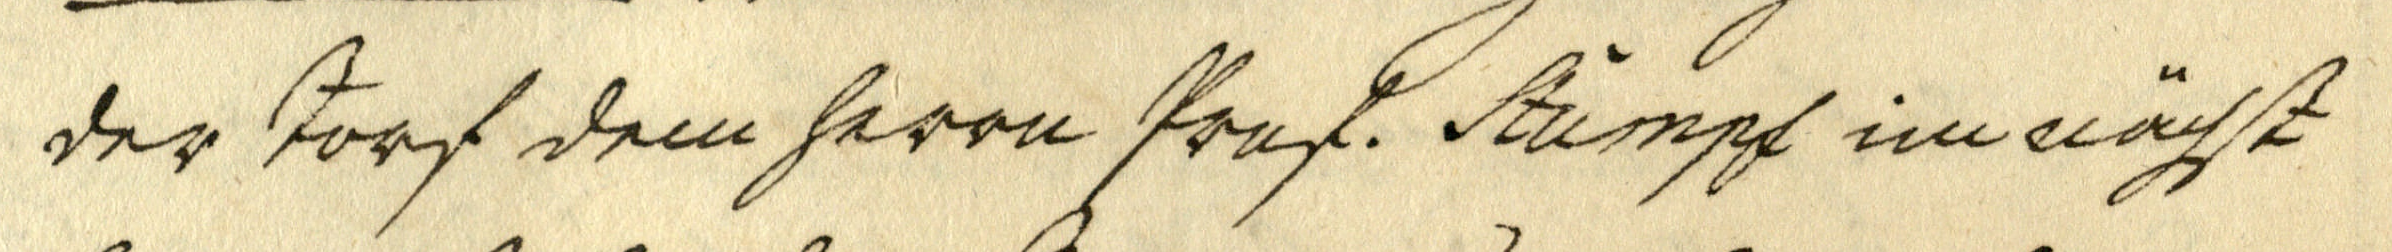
der Torf dem Herrn Prof. Stumpf im nächst
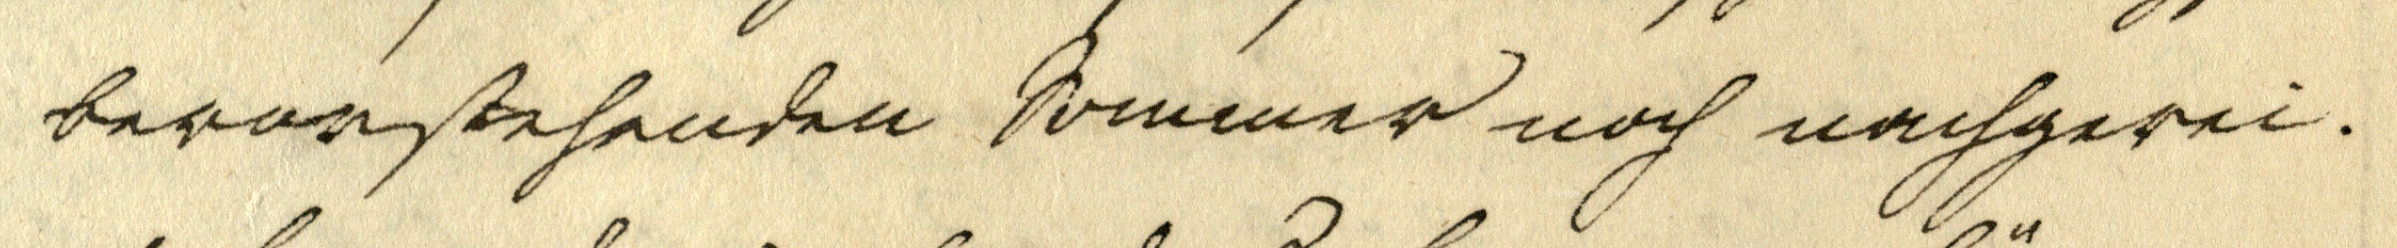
bevorstehenden Sommer noch nachgerei¬
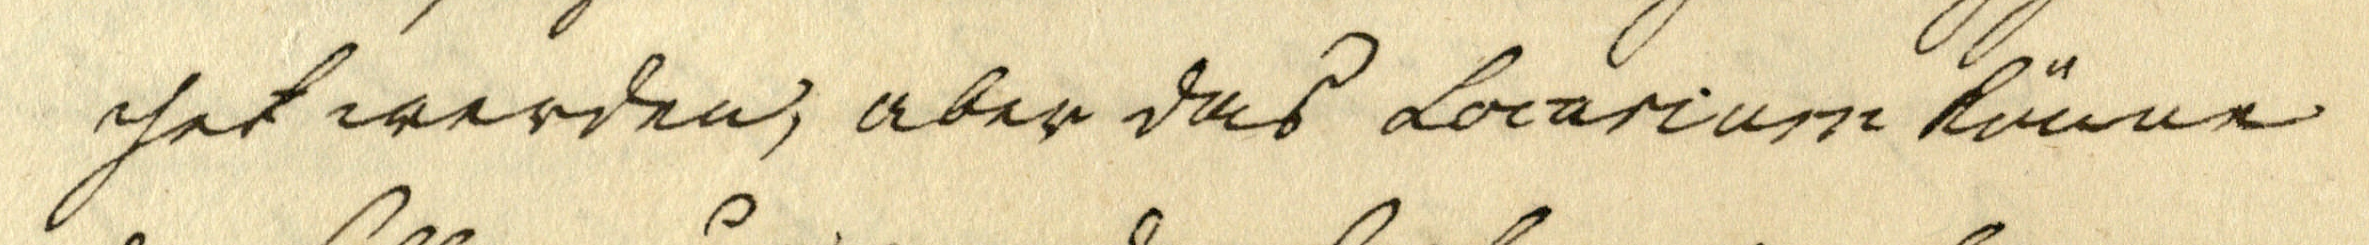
chet werden, aber das Locarium könne
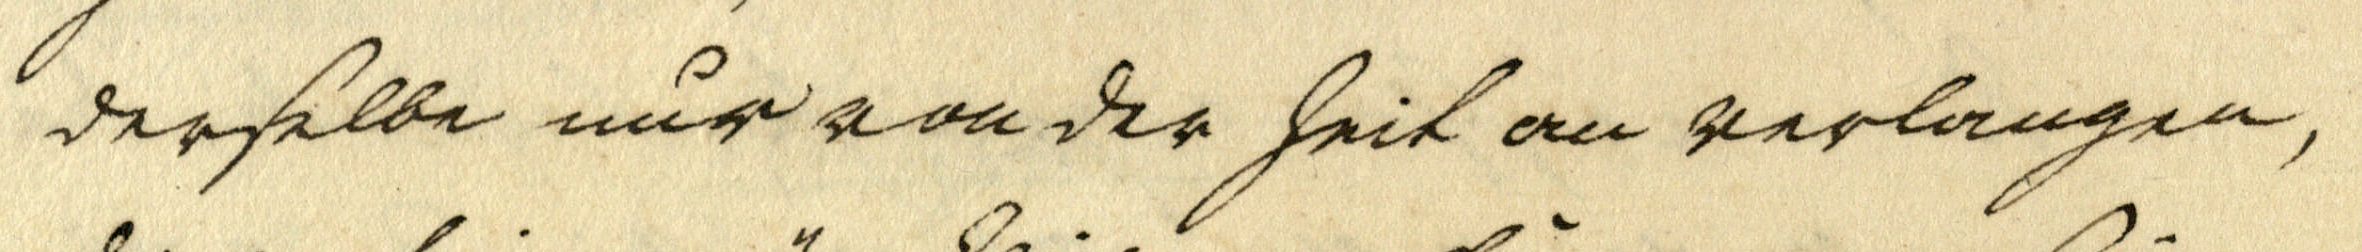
derselbe nur von der Zeit an verlangen,
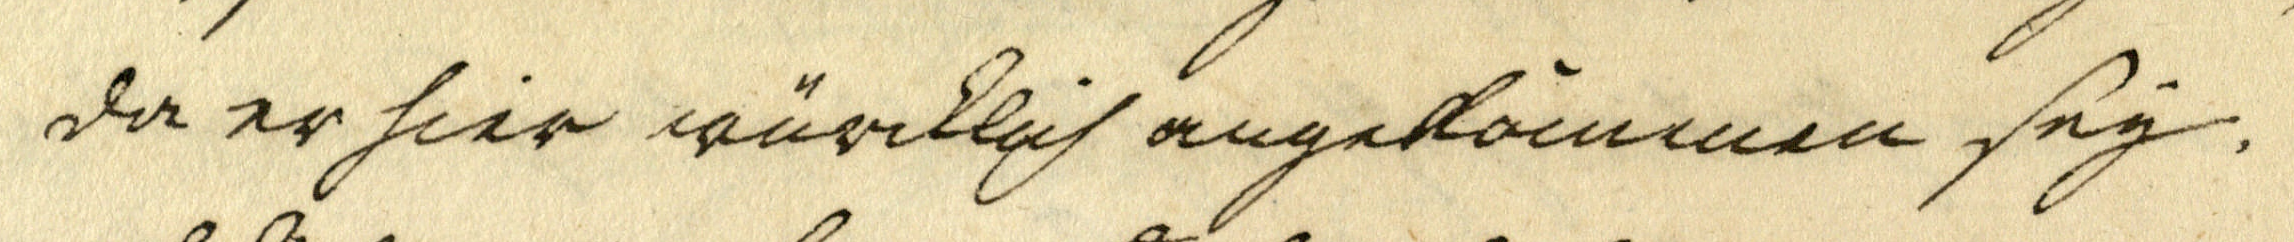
da er hier würcklich angekommen seÿ,
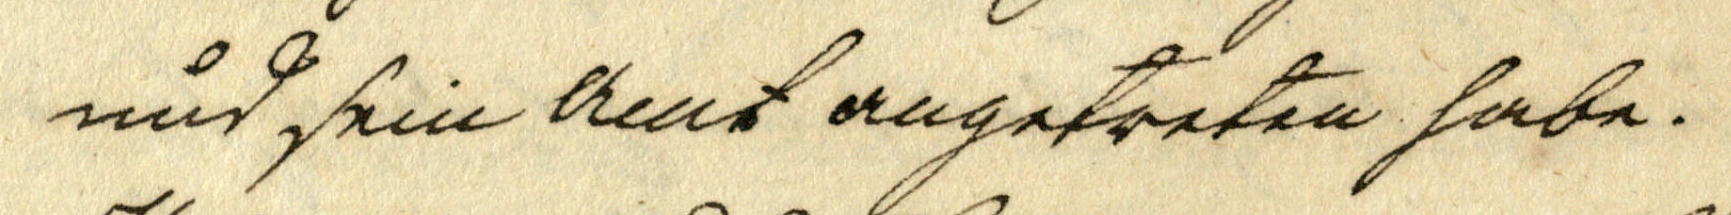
und sein Amt angetreten habe.
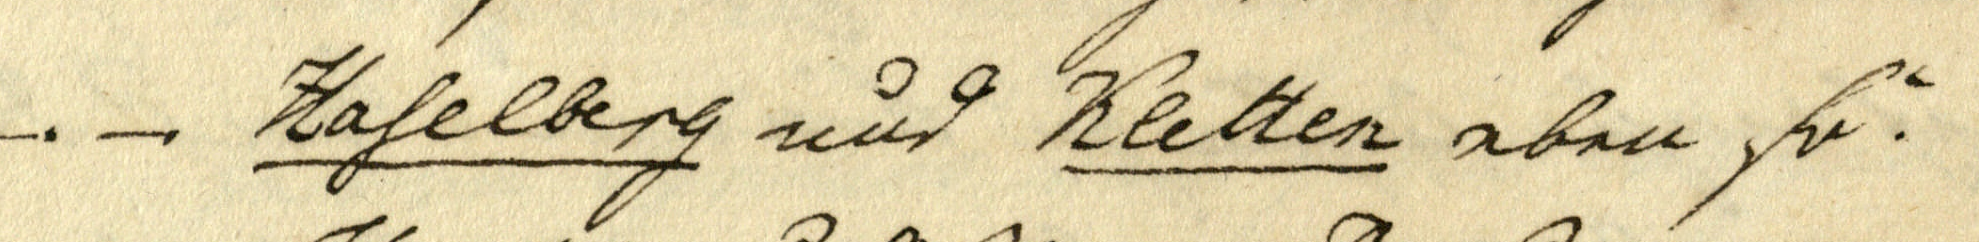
Haselberg und Kletten eben so.
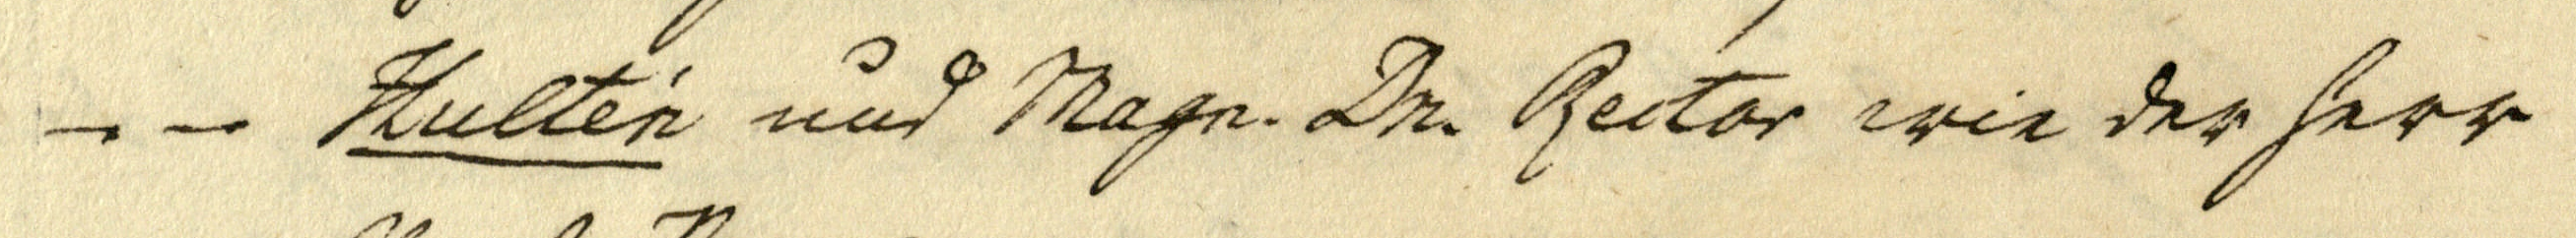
Hultén und Magn. Dn. Rector wie der Herr
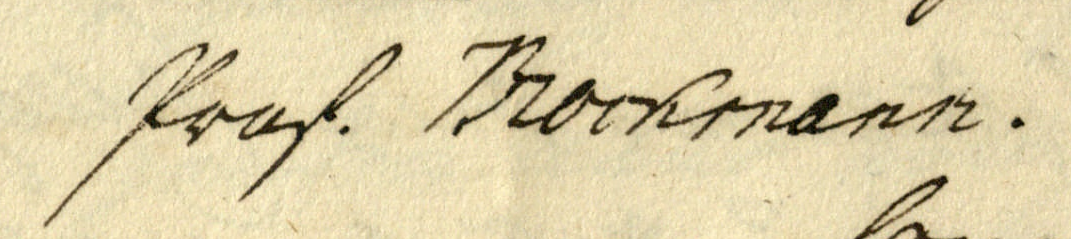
Prof. Brockmann.
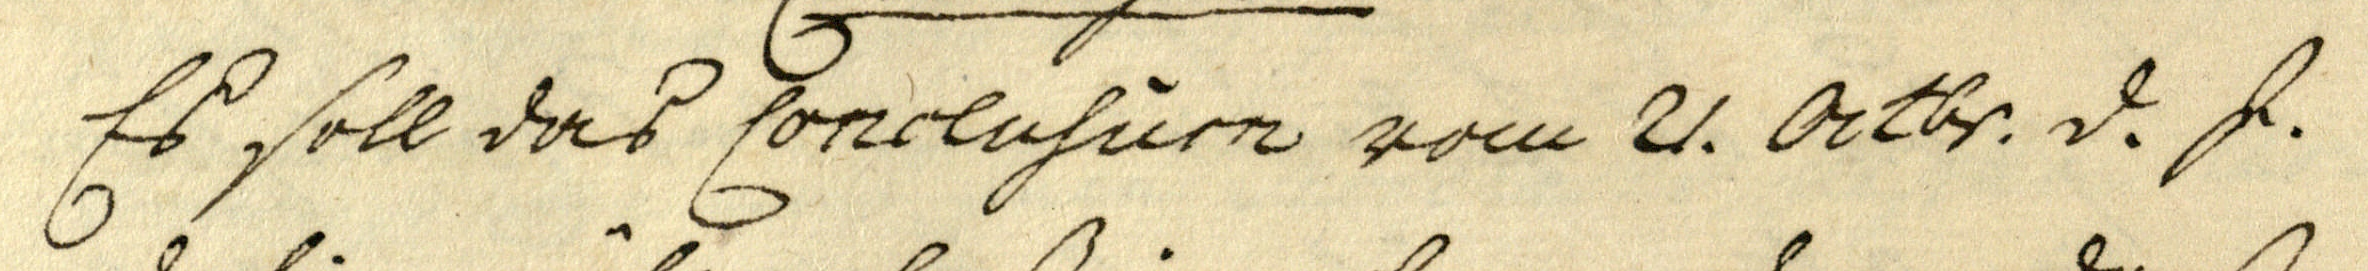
Es soll das Conclusum vom 21. Octbr. d. J.
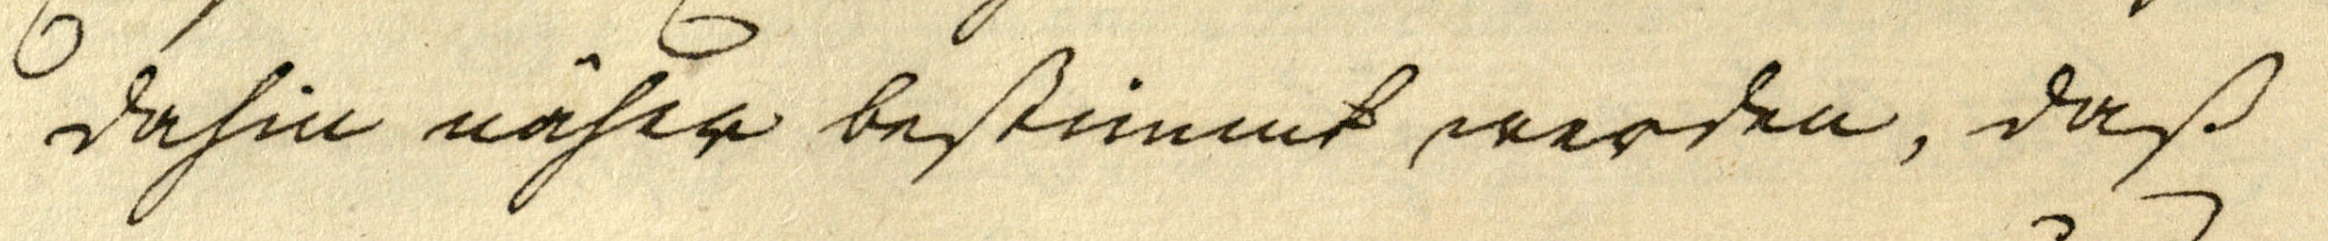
dahin näher bestimmt werden, daß
